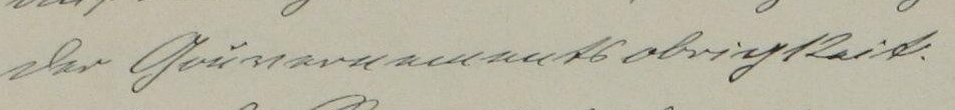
der Gouvernementsobrigkeit.
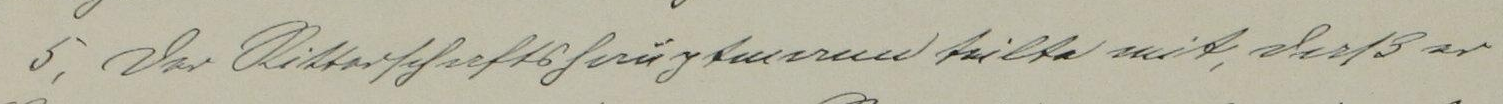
5. Der Ritterschaftshauptmann teilte mit, daß er
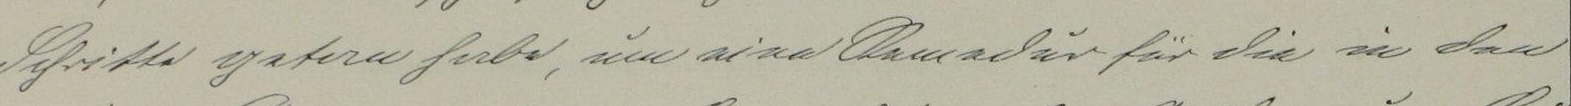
Schritte getan habe, um eine Remedur für die in den
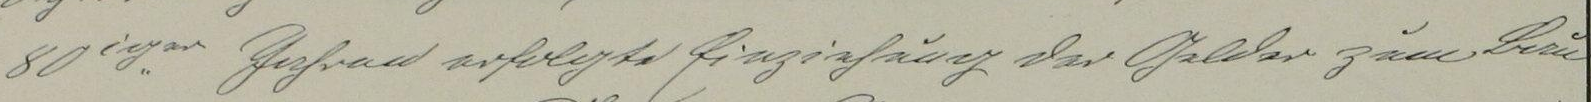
80iger Jahren erfolgte Einziehung der Gelder zum Bau
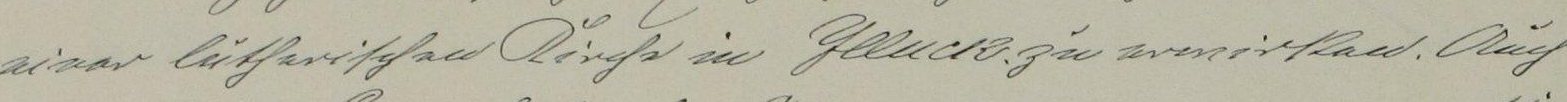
einer lutherischen Kirche in Illuck zu erwirken. Auch
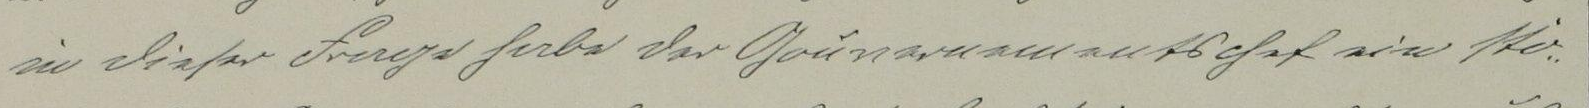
in dieser Frage habe der Gouvernementschef ein stö-
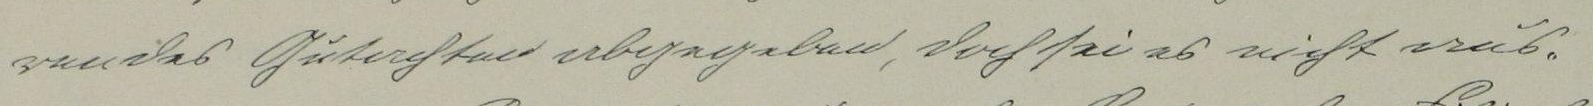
rendes Gutachten abgegeben, doch sei es nicht aus-
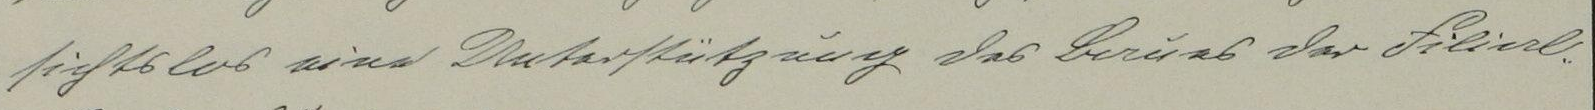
sichtslos eine Unterstützung des Baues der Filial-
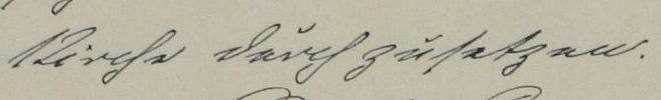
kirche durchzusetzen.
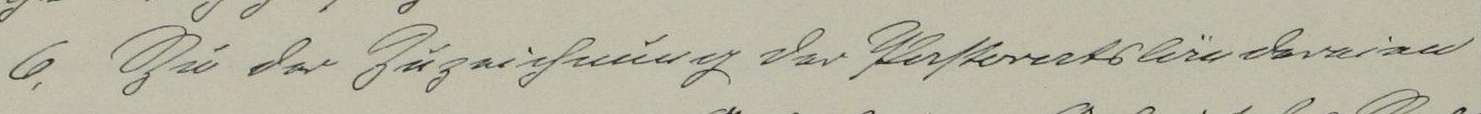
6. Zu der Zuzeichnung der Pastoratsländereien
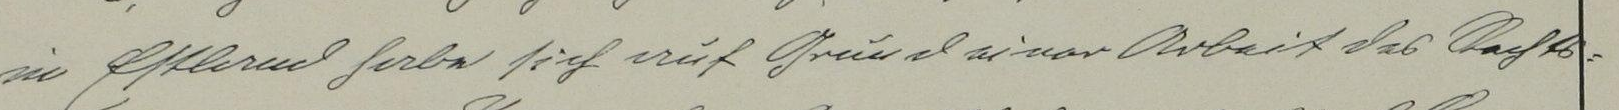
in Estland habe sich auf Grund einer Arbeit des Rechts-
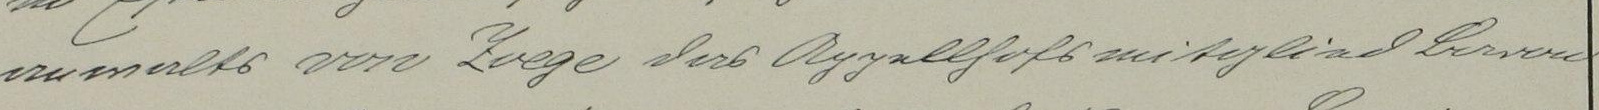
anwalts von Zoege das Appellhofsmitglied Baron
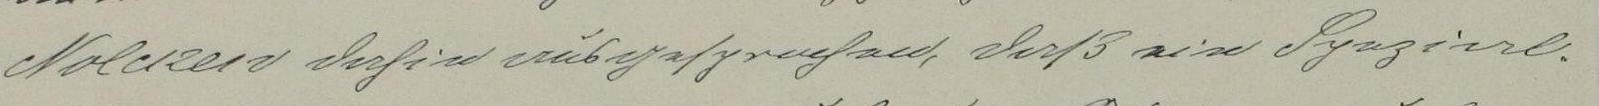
Nolcken dahin ausgesprochen, daß ein Spezial-
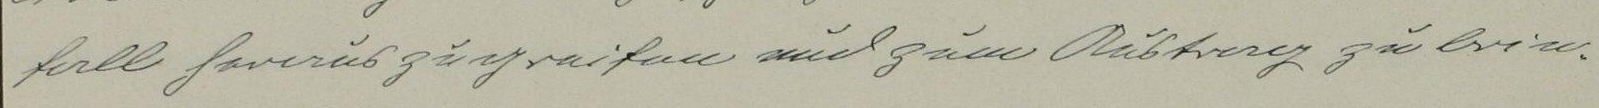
fall herauszugreifen und zum Austrag zu brin-
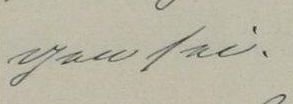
gen sei.
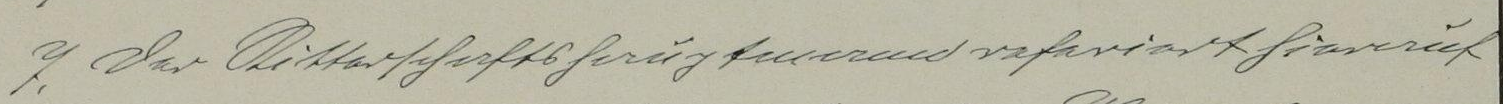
7. Der Ritterschaftshauptmann referiert hierauf
